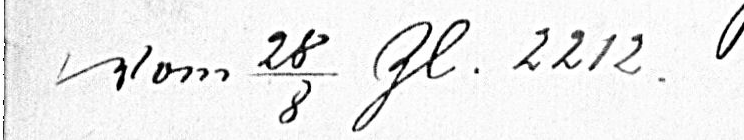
vom 28/8 Zl. 2212.
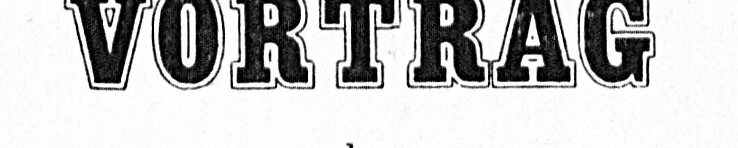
VORTRAG
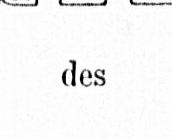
des
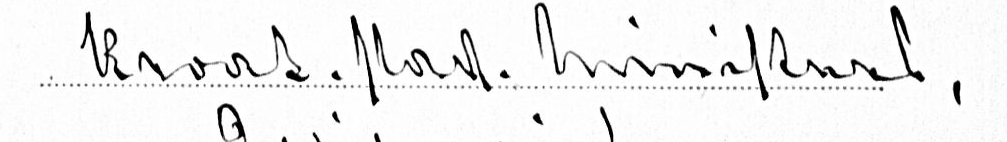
kroat. slav. Ministers,
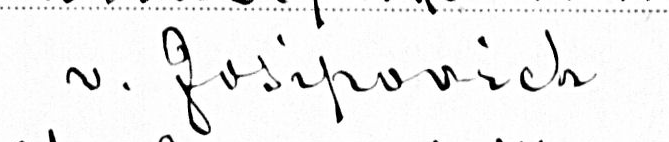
v. Josipovich
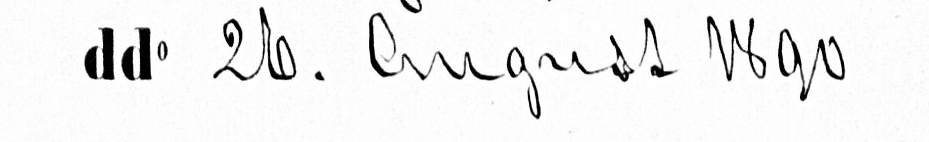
dd° 26. August 1890
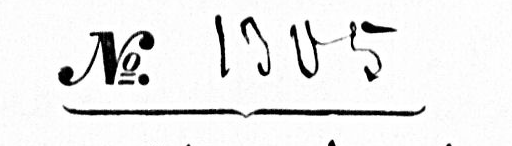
N° 1305
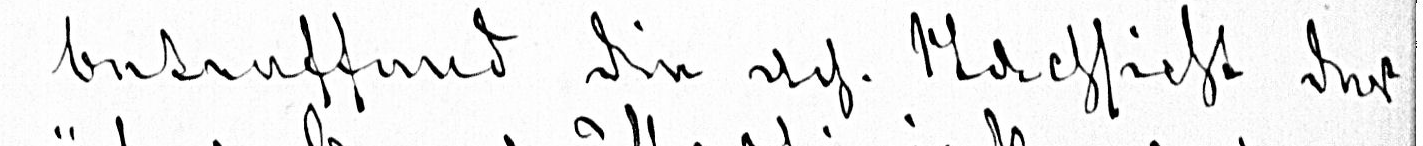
betreffend die ag. Nchsicht der
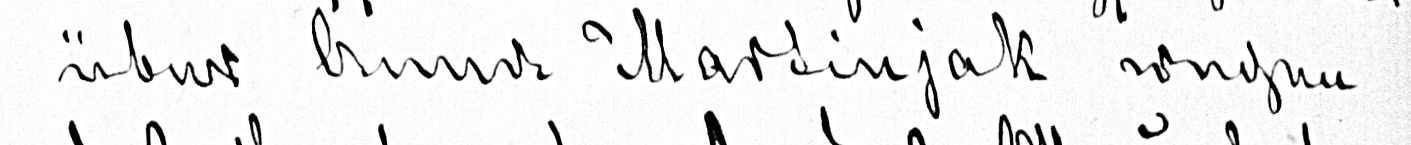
über Anna Martinjak wegen
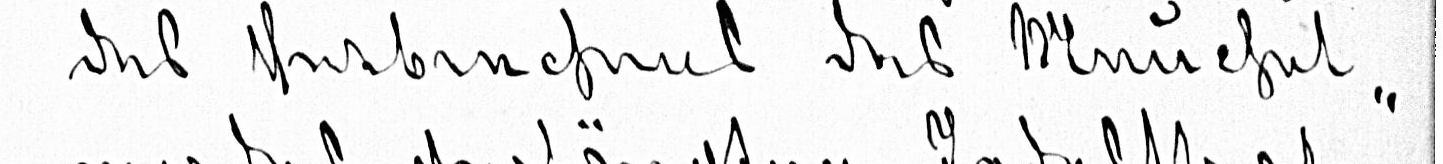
des Verbrechens des Meuchel¬
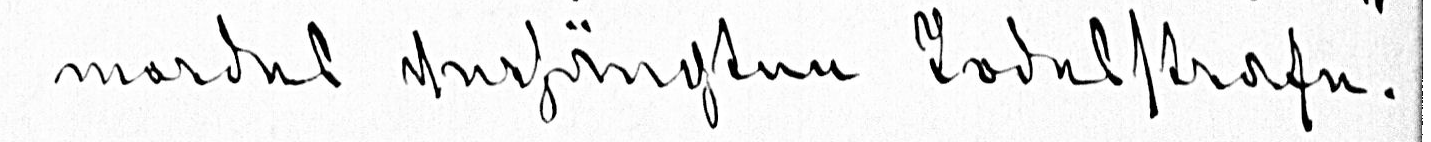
mordes verhängten Todesstrafe.
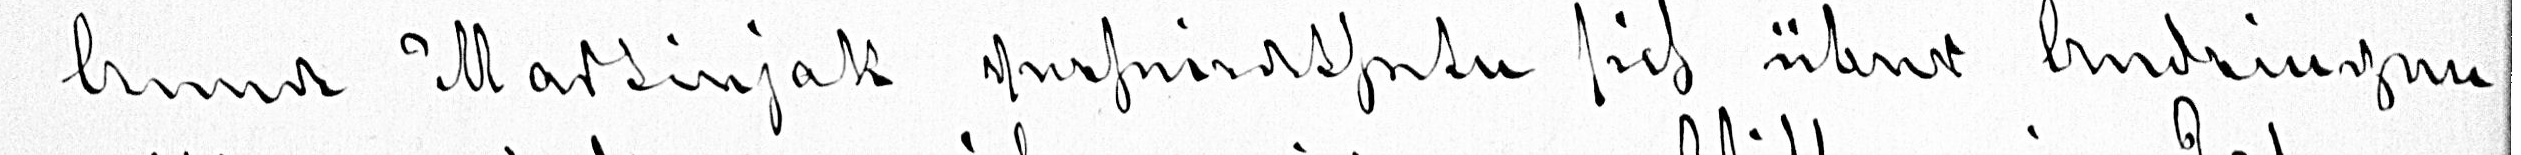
Anna Martinjak verheirathete sich über Andringen
